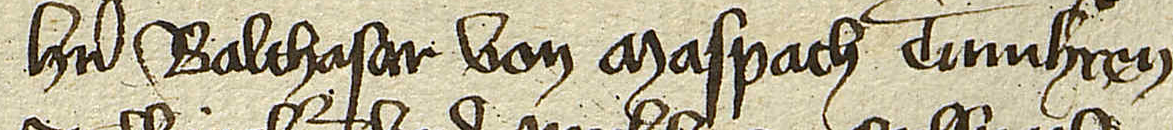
hn* Balthaſar von Maſpach Tumh*ren
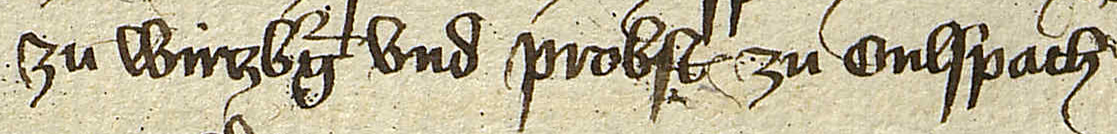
cʒu wircʒbg* vnd Probſt cʒu Onlſpach
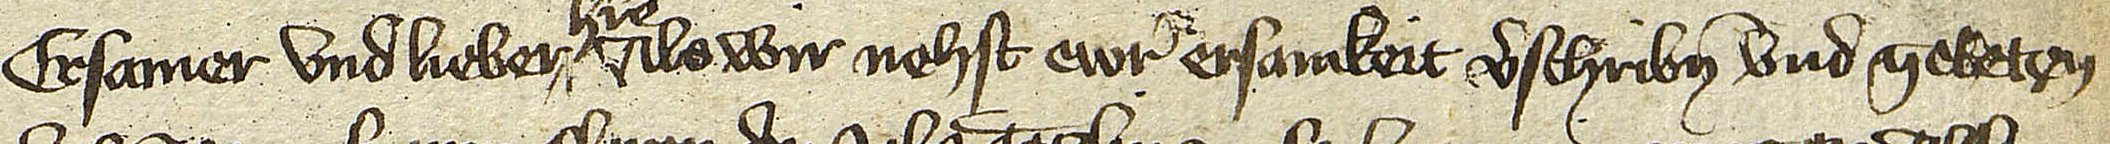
Erſamer vnd lieber Als wir nehſt ewr* erſamkeit v*ſchribn* vnd gebeten
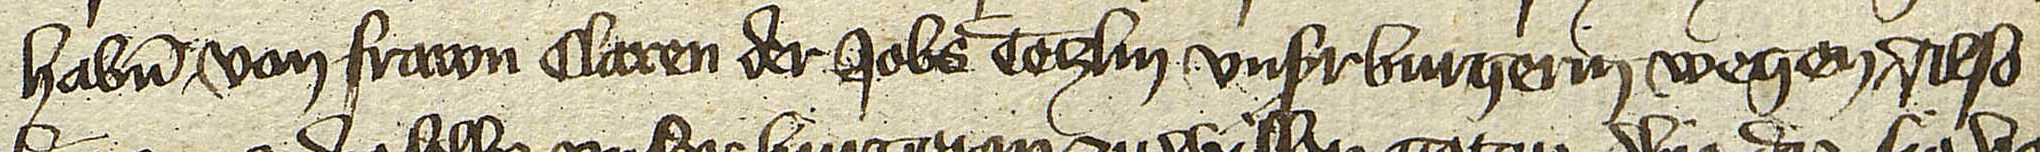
habn* von frawn Claren der Iobs Tecʒlin vnſ*r burgerin wegen / Alſo
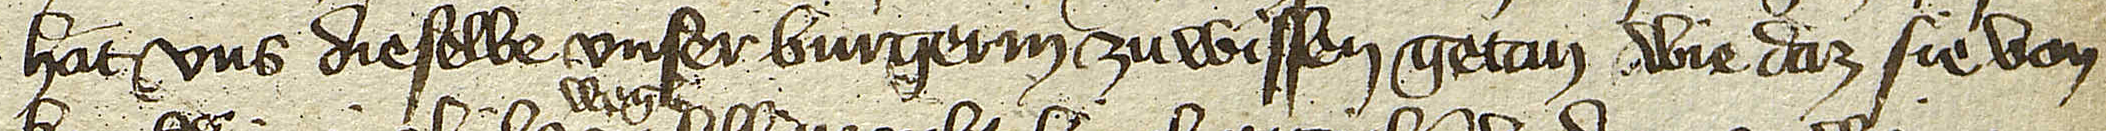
hat vns dieſelbe vnſer burgerin cʒu wiſſen getan / wie daʒ ſie von
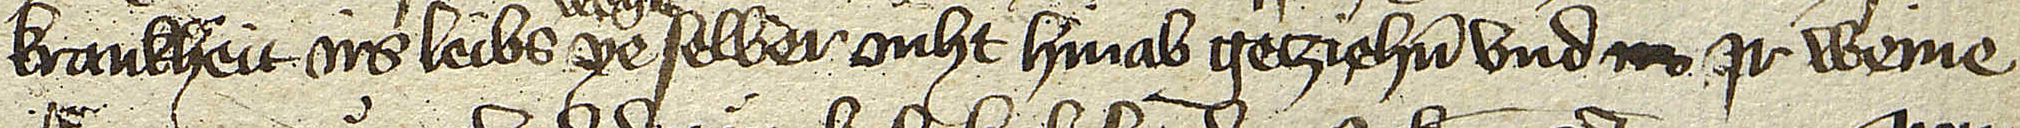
krankheit irs leibs ye ſelber niht hinab gecʒiehn* vnd ir Ir weine
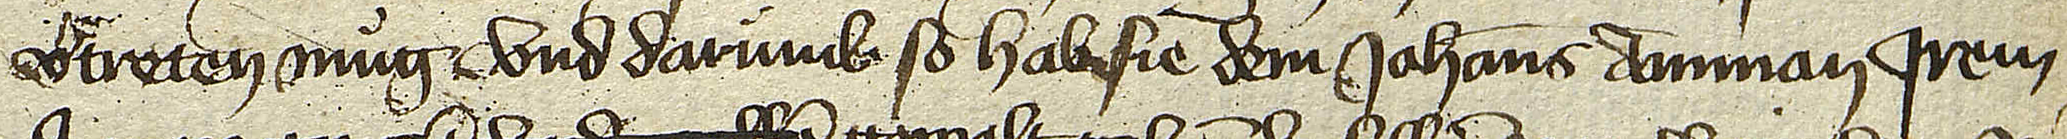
v*treten müg* / vnd darümb ſo hab ſie dem Iohan*s Amman Irem
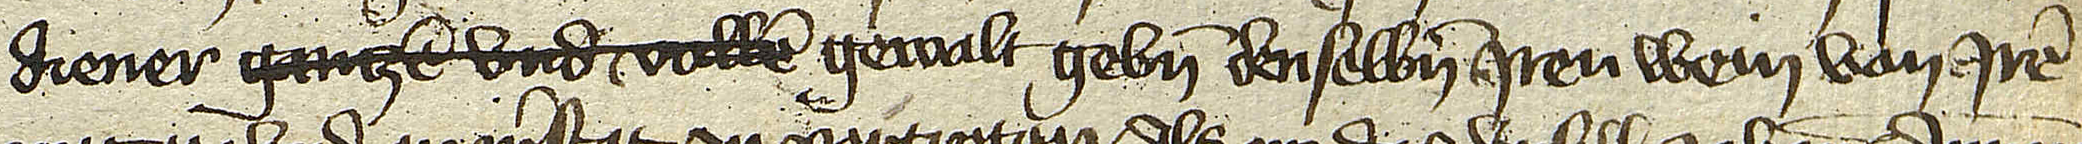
diener gancʒe* vnd volle* gewalt gebn* denſelbn* Iren wein von Ire*
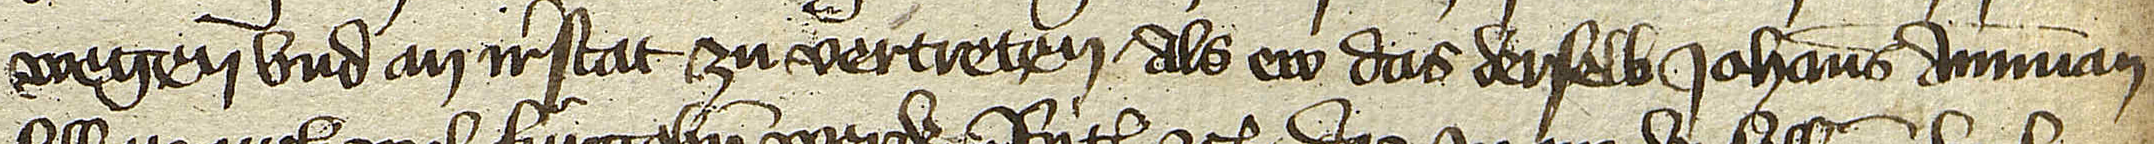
wegen vnd an ir*ſtat cʒu vertreten / Als ew das derſelb Iohans Amman
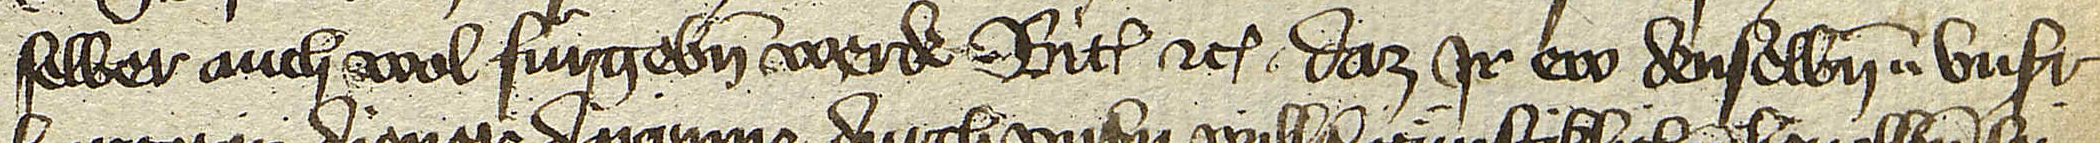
ſelber auch wol fürgebn* werde Bit* ec* / daʒ Ir ew denſelbn* ~ vnſr
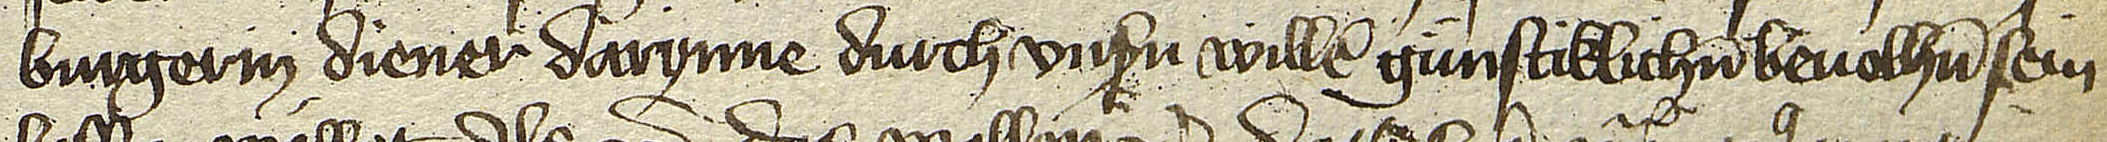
burgerin diener darynne durch vnſ*n wille* günſtiklichn* beuolhn* ſein
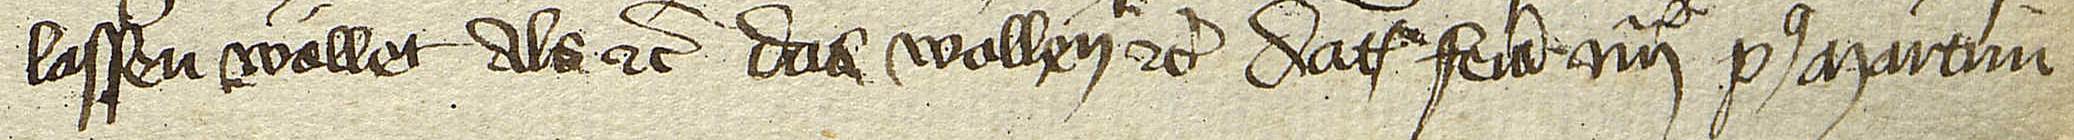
laſſen wöllet Als ec* das wollen ec* Dat* feia* iiii* p* Martini
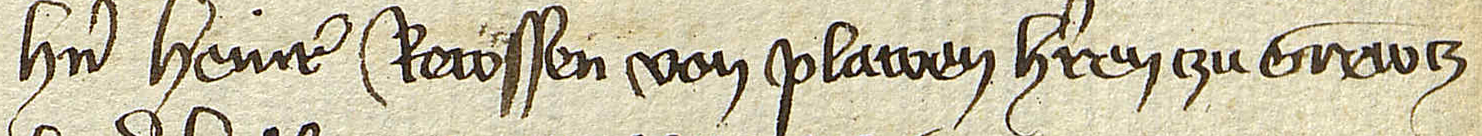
hn* heinr* Rewſſen von plawen h*ren cʒu Grewcʒ
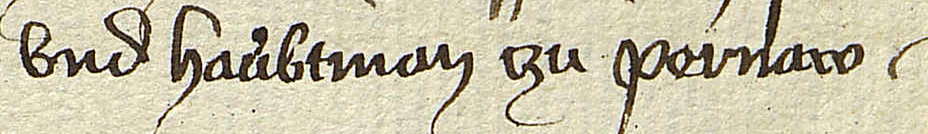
vnd haubtman cʒu pernaw /
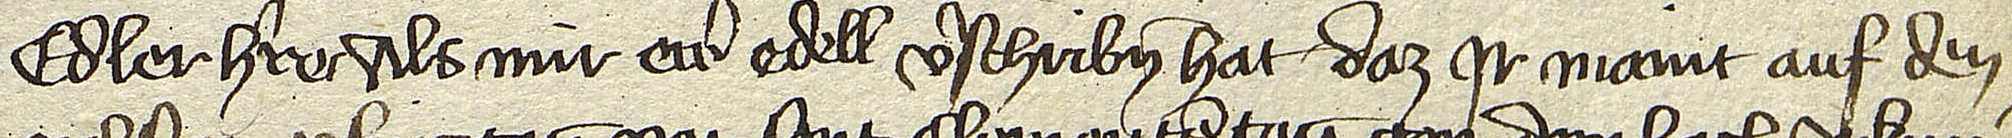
Edler h*re / Als mir ew* edell v*ſchribn* hat / daʒ Ir maint auf den
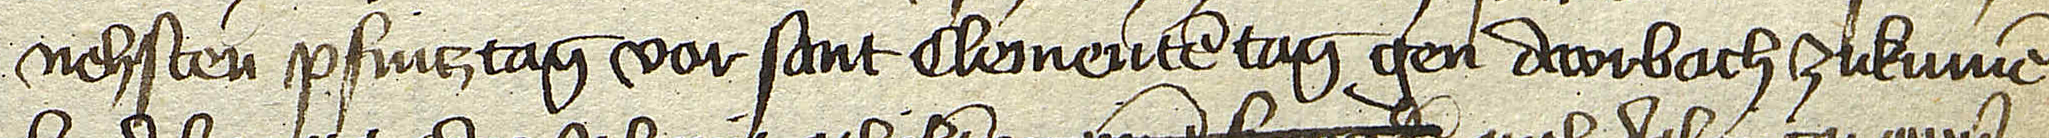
nehſten pfincʒtag vor ſant Clemente* tag gen Awrbach cʒukume*
